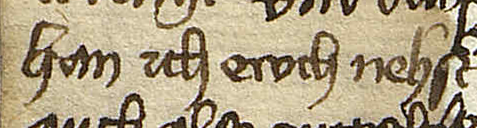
han ich ewch nehſt
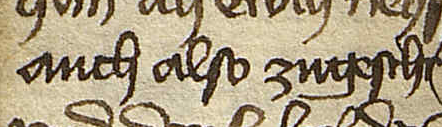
auch alſo ʒugeſchr*
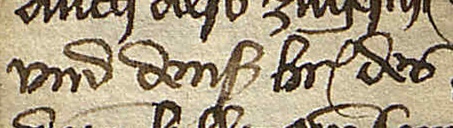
vnd denſ* br* des
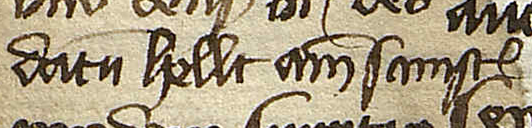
datu* hellt am* ſamſt*
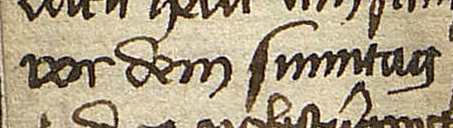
vor dem ſunntag
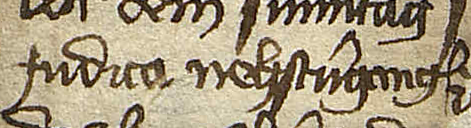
Iudica nehſtu*gang*
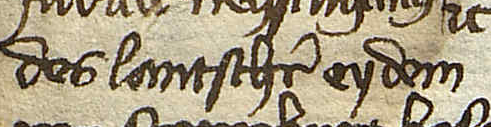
des lantſchr* eydem
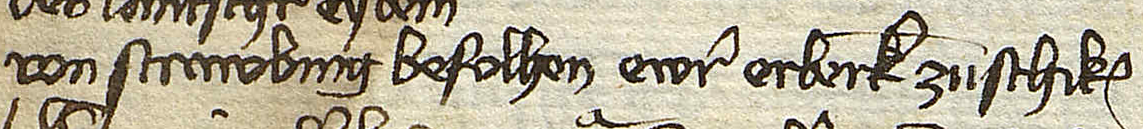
von Strawburg befolhen ew*r erberk* ʒu ſchik*
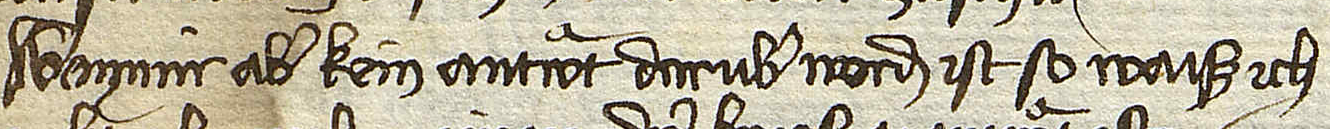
Wan mir ab* kein antw*t darub* word* iſt ſo waiſʒ ich
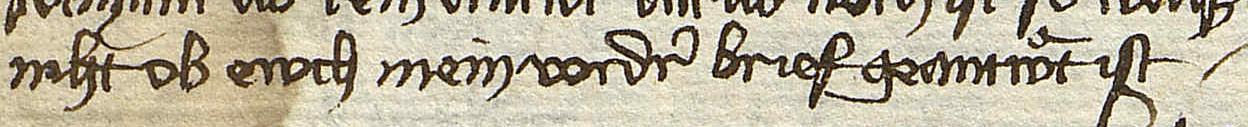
niht ob ewch mein vordr* brief geantw*t iſt /
